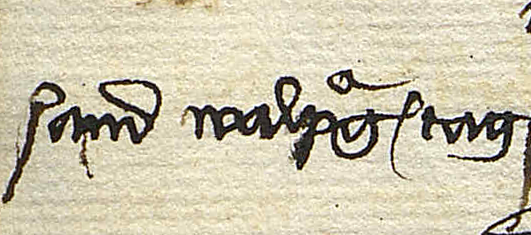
ſand walp*g* tag
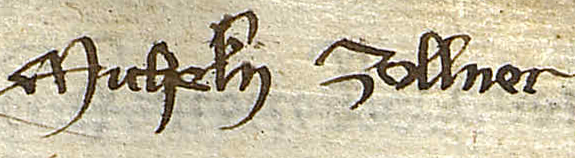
Micheln Ʒollner
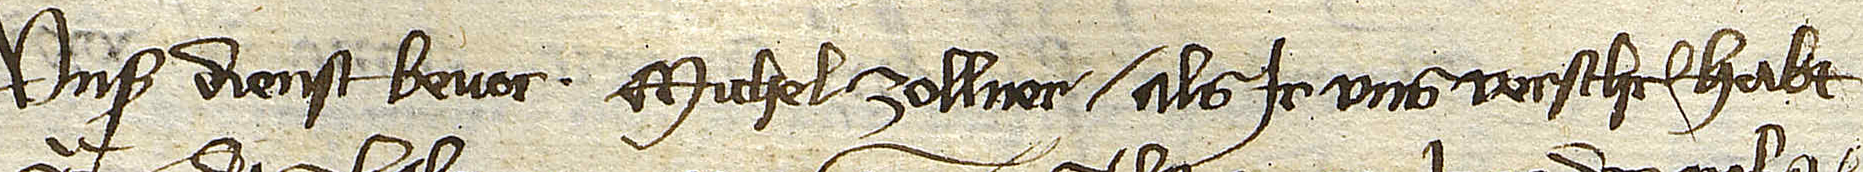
Vnſ* dienſt beuor . Michel ʒollner / als Ir vns verſchr* habt
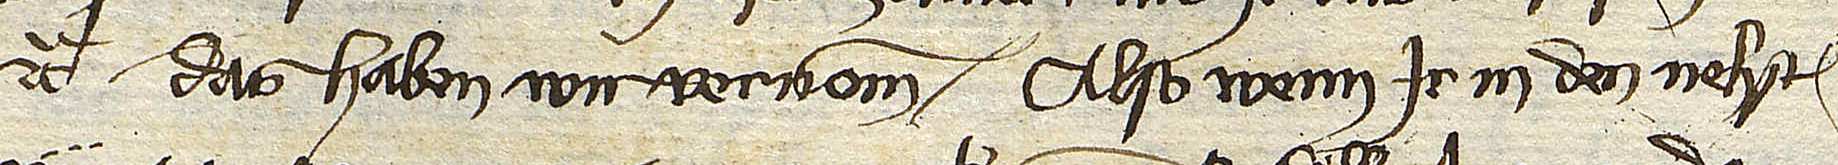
ec* / das haben wir vernom* / Alſo wenn Ir in den nehſt*
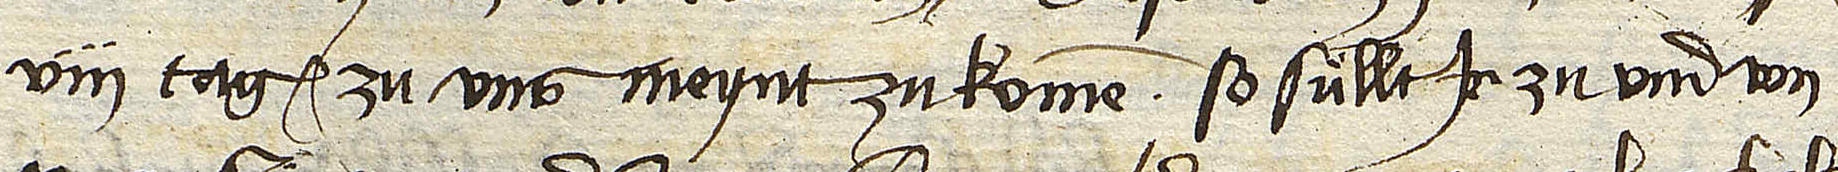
viii tag* ʒu vns meynt ʒu kome* . ſo ſüllt Ir ʒu vnd von
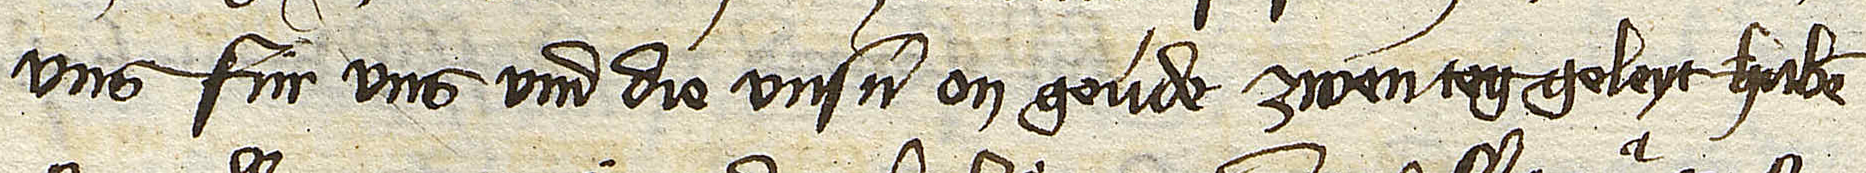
vns für vns vnd die vnſ*n on geu*de ʒwen tag geleyt habe*
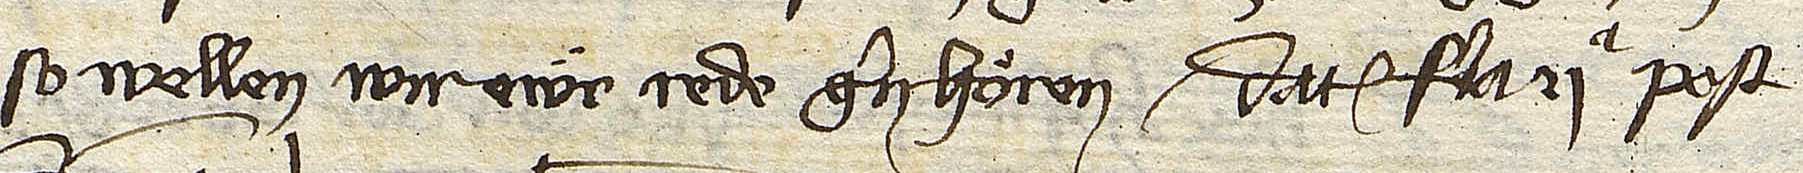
ſo wellen wir ewr rede g*n hören / Dat* fia* ii* poſt
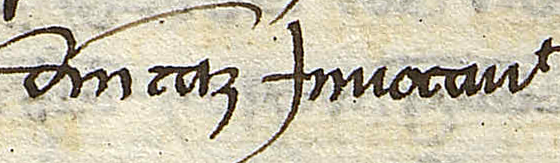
dmca* Inuocau*
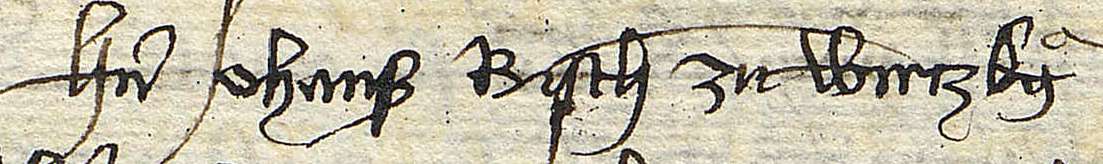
H*n Iohanſ* Biſch* ʒu Wircʒb*g
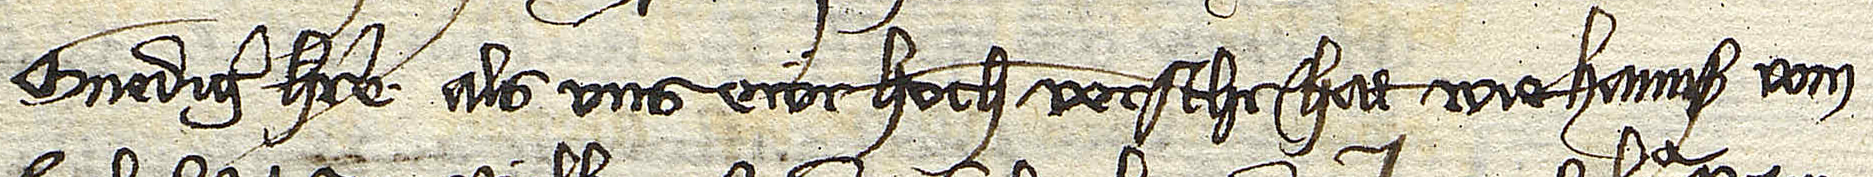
Gnedig* h*re . als vns ewr hoch* verſchr* hat wie hannſ* vom
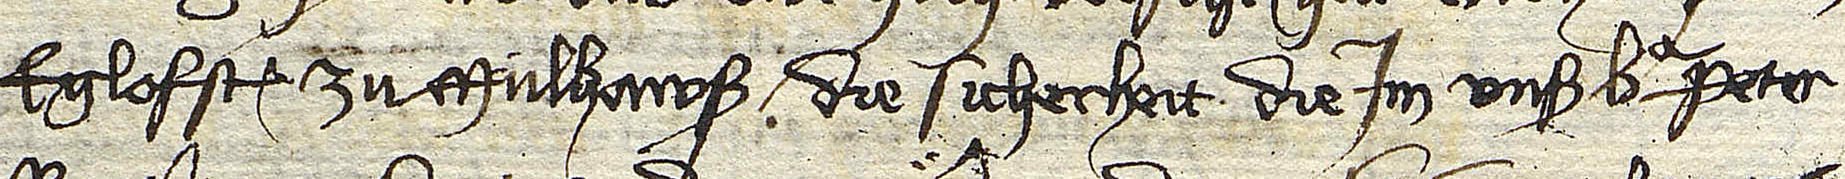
Eglofſt* ʒu Mülhawſ* / die ſicherheit . die Im vnſ* b* Peter
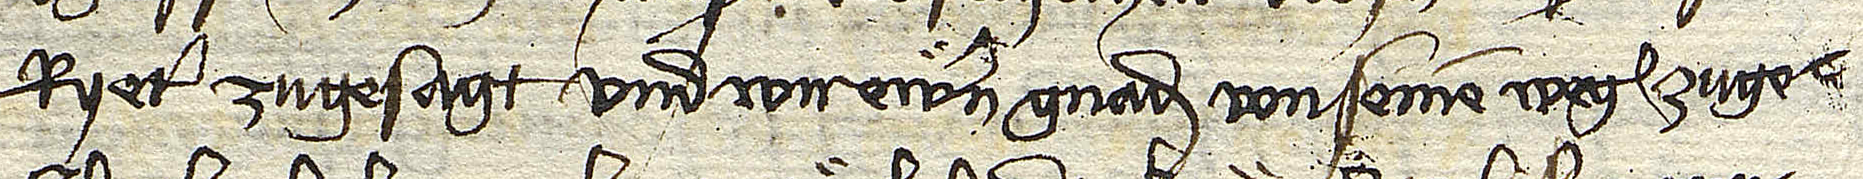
Ryet* ʒugeſagt vnd wir ew*n gnad* von ſeine* weg* ʒuge =
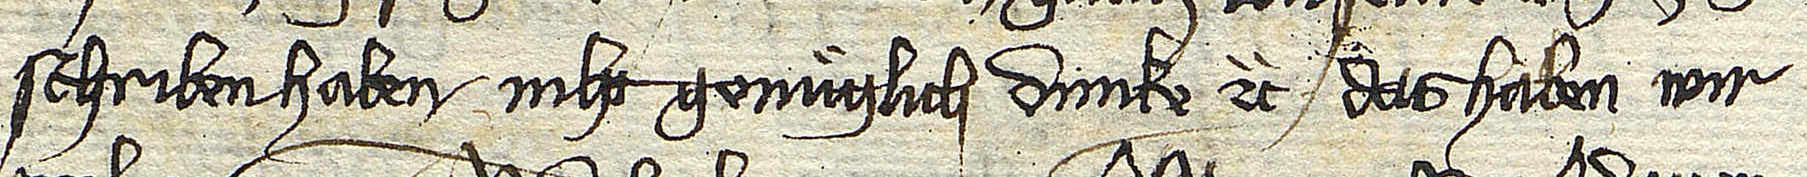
ſchriben haben / niht genüglich dunke ec* das haben wir
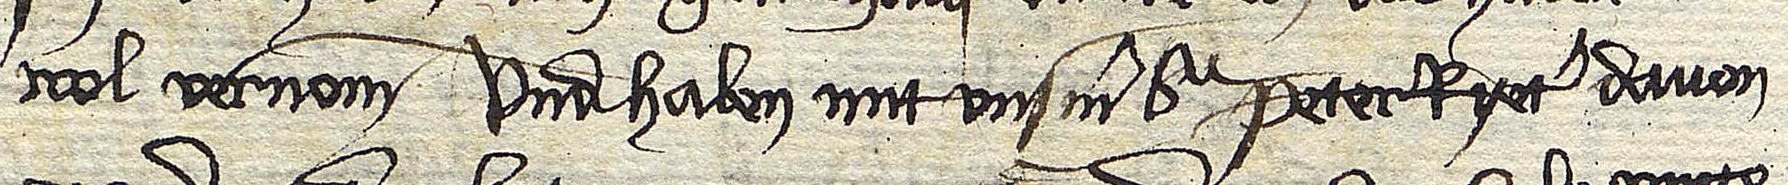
wol vernom* / Vnd haben mit vnſ*m b* Peter Ryet* dauon
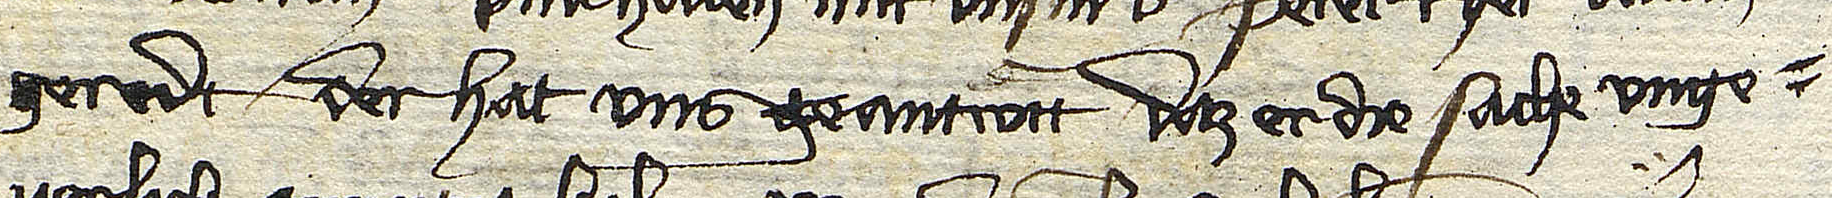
geredt / Der hat vns geantw*tt / Daʒ er die ſache vnge =
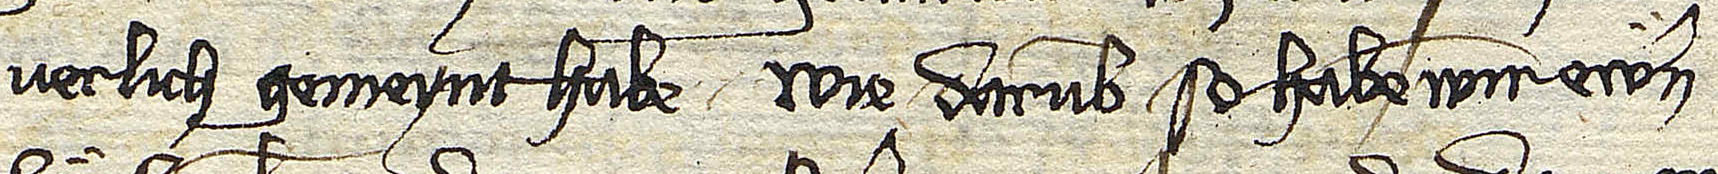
uerlich gemeynt habe / wie daru*b / ſo habe* wir ew*n
